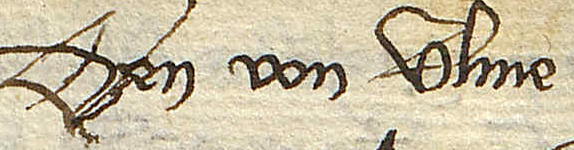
Den von Vlme
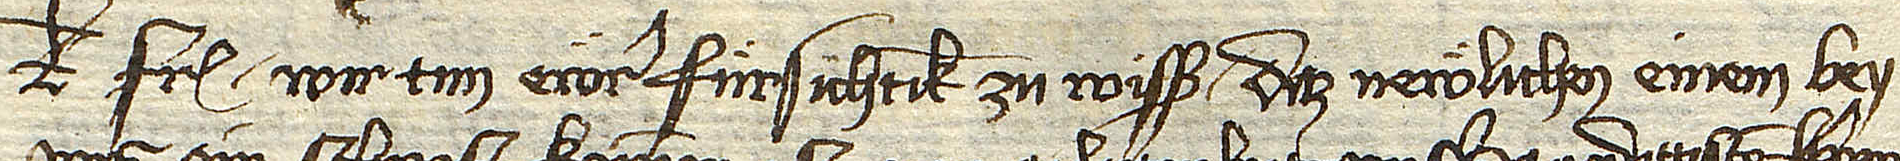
L* fr* / wir tun ew*r fürſichtik* ʒu wiſſ* / daʒ newlichen einem bey
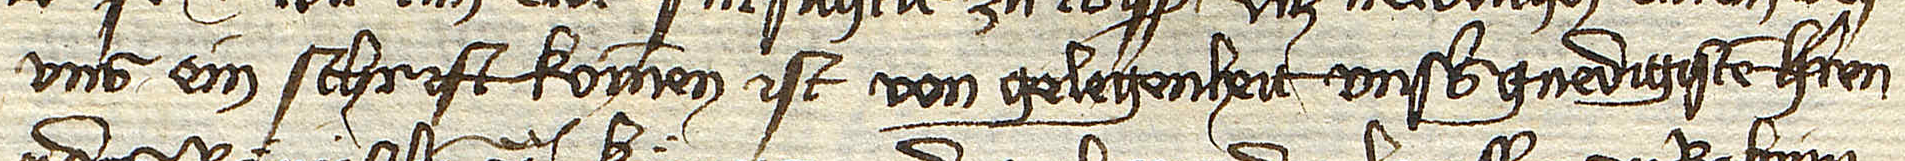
vns ein ſchrift kom*en iſt von gelegenheit vnſ*s gnedigiſte* h*ren
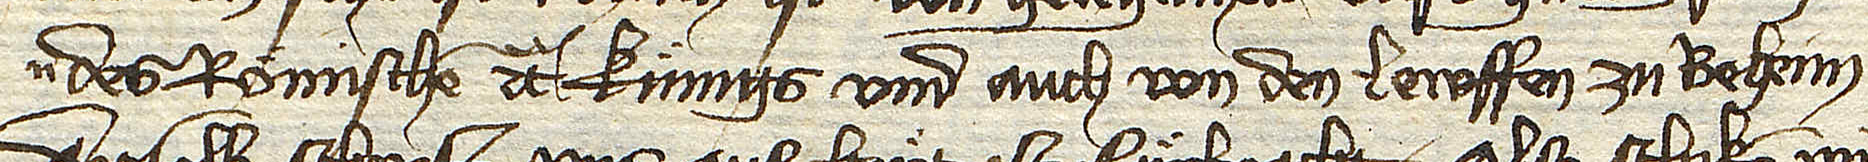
~ des Römiſche* ec* künigs vnd auch von den lewffen ʒu Beheim
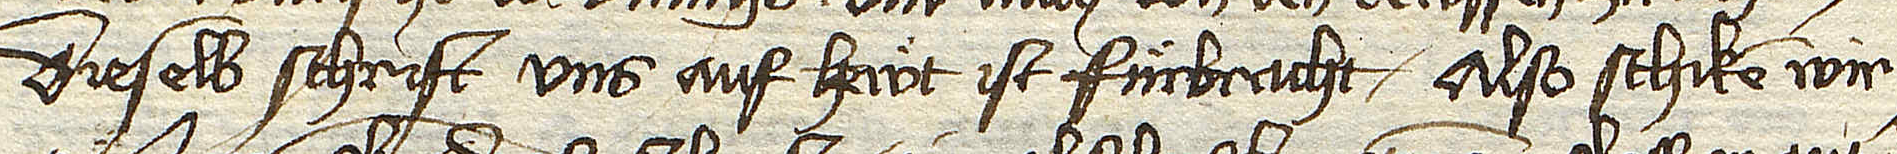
Dieſelb ſchrift vns auf hewt iſt fürbracht / Alſo ſchike* wir
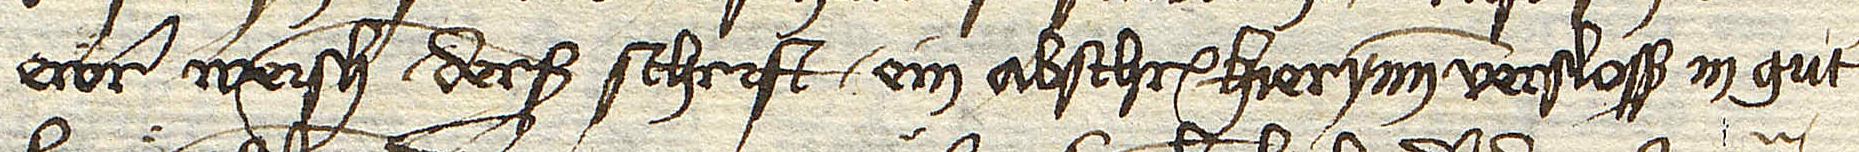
ew*r weiſh* / derſ* ſchrift / ein abſchr* hierynn* verſloſſ* in gut*
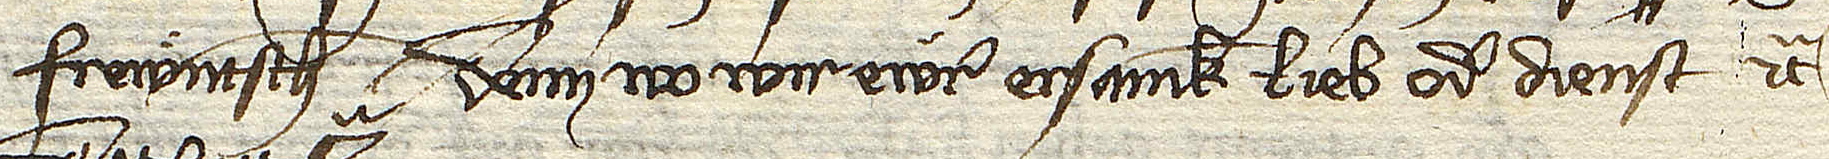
frewntſch* / Denn wo wir ew*r erſamk* lieb od* dienſt ec*
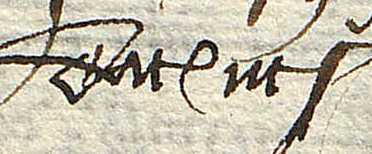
Dat* ut ſ*
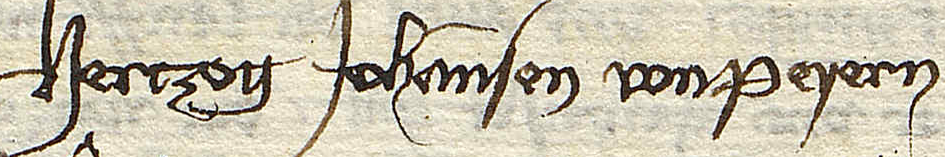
Hercʒog Iohanſen von Peyern
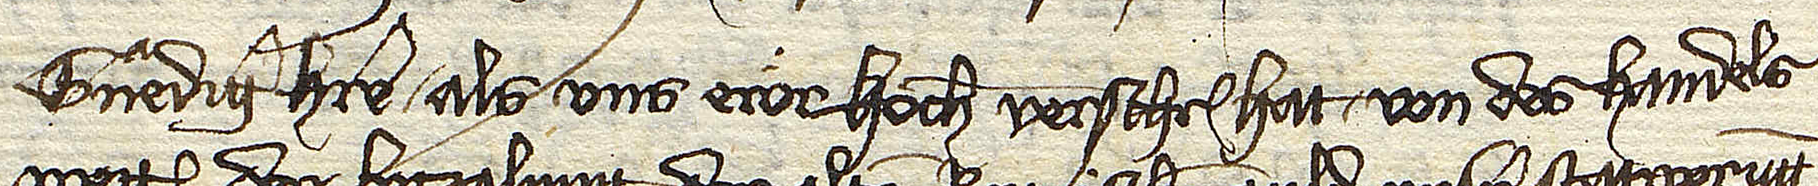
Gnëdig* h*re / als vns ewr hoch* verſchr* hat / von des handels
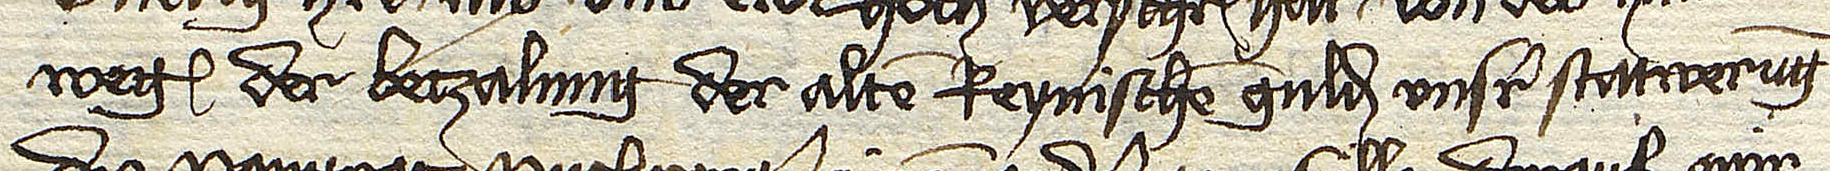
weg* der becʒalung der alte* Reyniſche* guld* vnſ*r ſtatweru*g
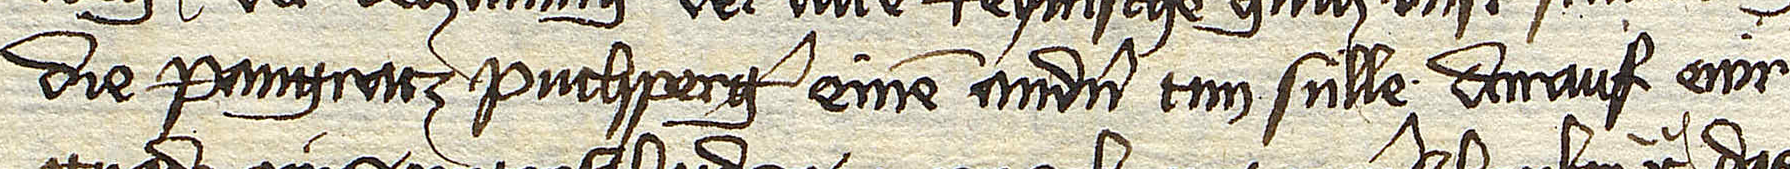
die Pangracʒ Puchperg* eine* and*n tun ſülle . darauf ewr
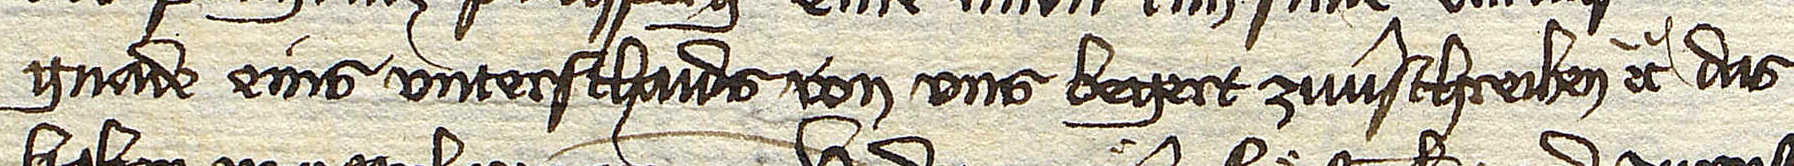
gnade eins vnterſchaids von vns begert ʒuu*ſchreiben ec* das
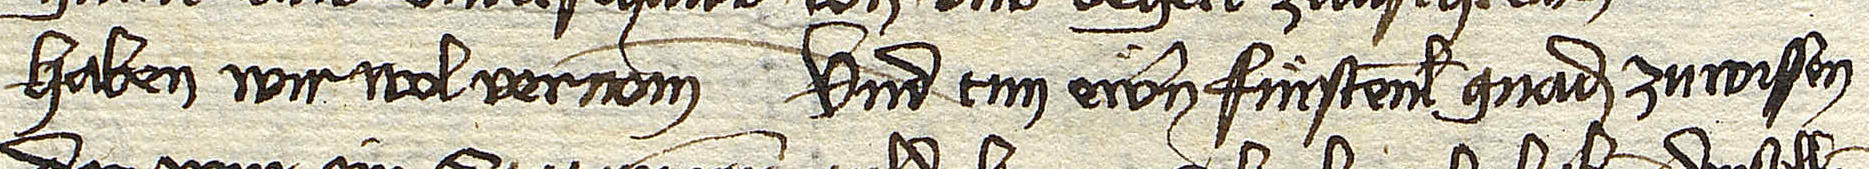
haben wir wol vernom* / Vnd tun ew*n fürſtenl* gnad* ʒu wiſſen
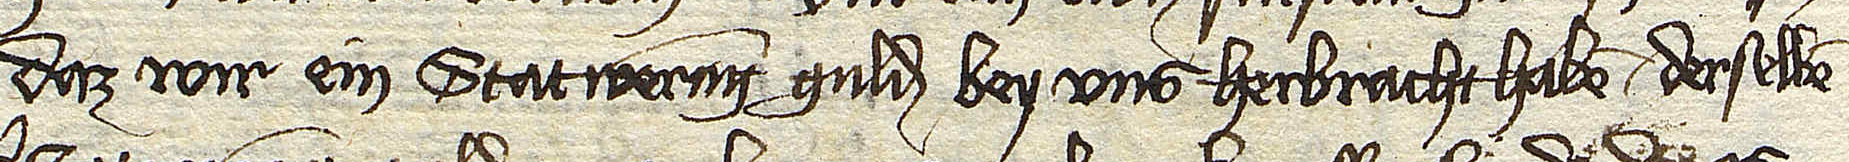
daʒ wir ein Statweru*g guld* bey vns herbracht habe* / derſelbe*
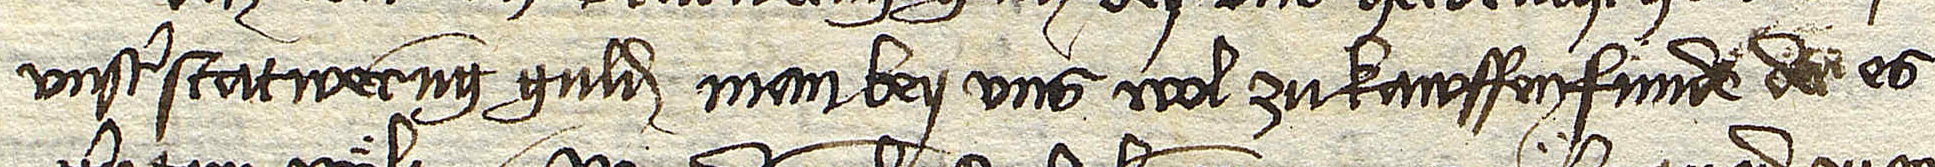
vnſ*r ſtatweru*g guld* man bey vns wol ʒu kawffen finde der es
